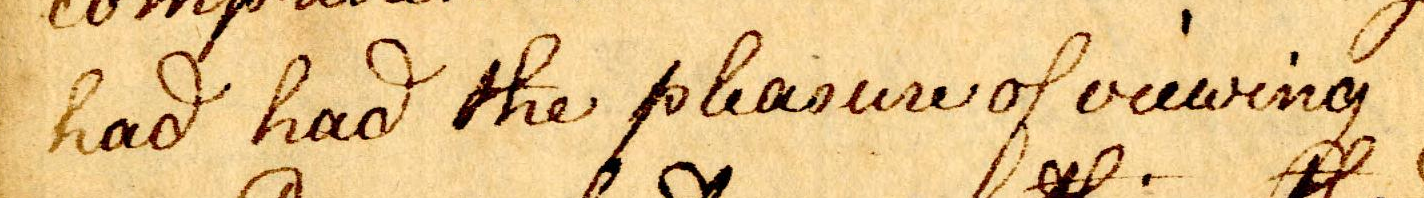had had the pleasure of viewing
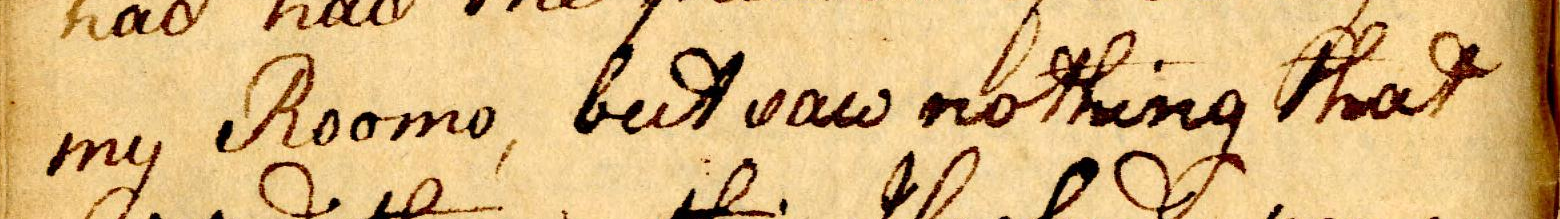my Rooms, but saw nothing that
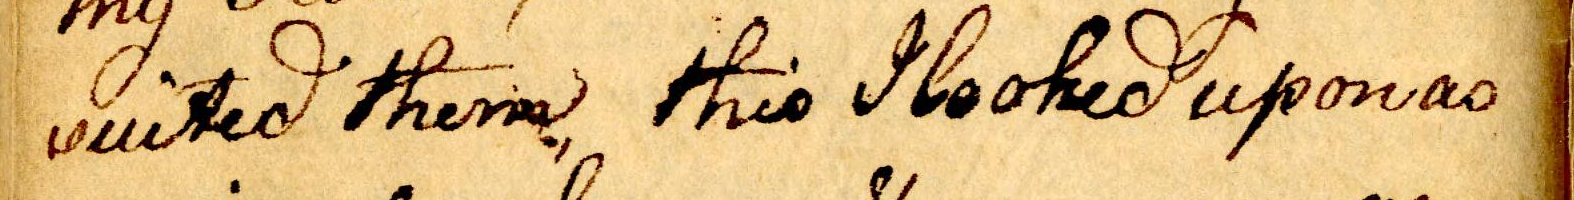suited them, this I looked upon as
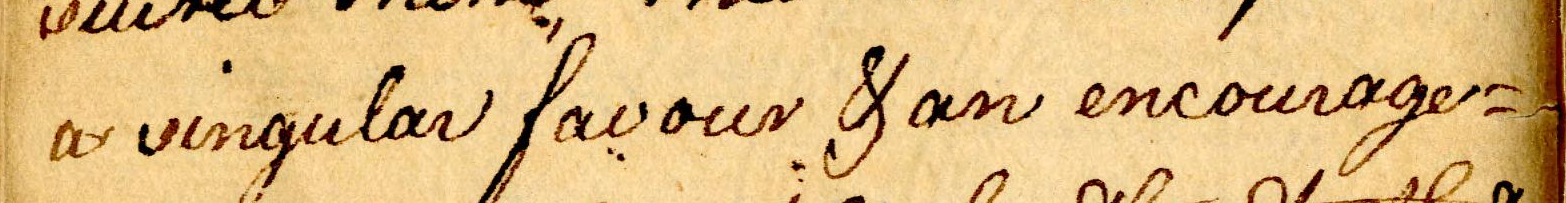a singular favour & an encourage-
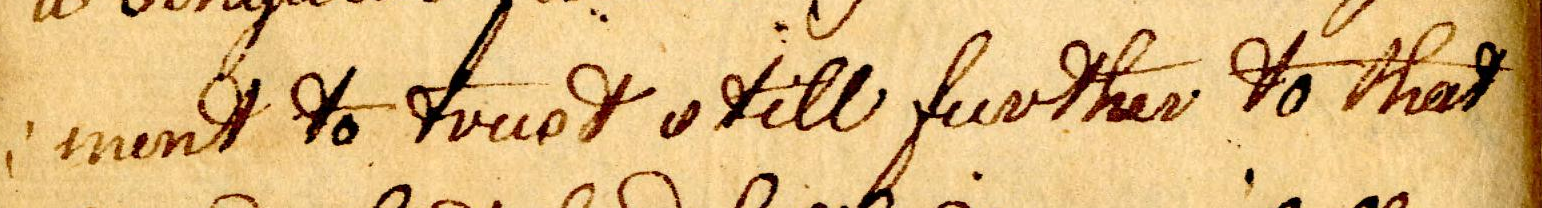-ment to trust still further to that
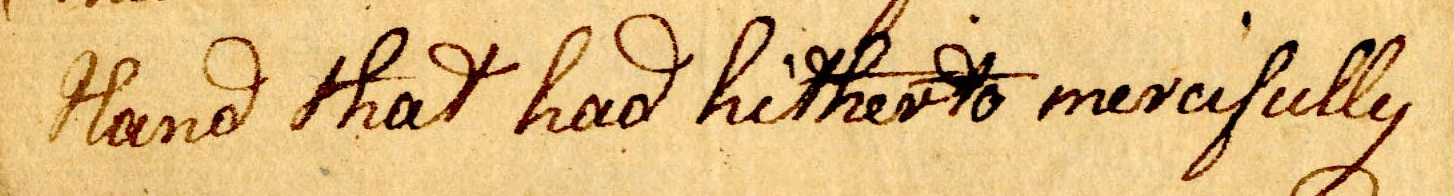Hand that had hitherto mercifully
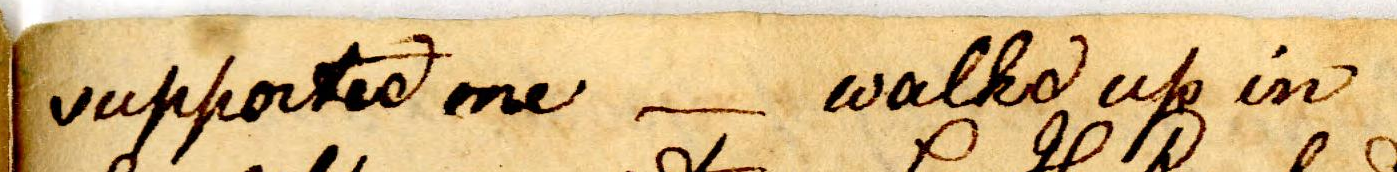supported me- walkd up in
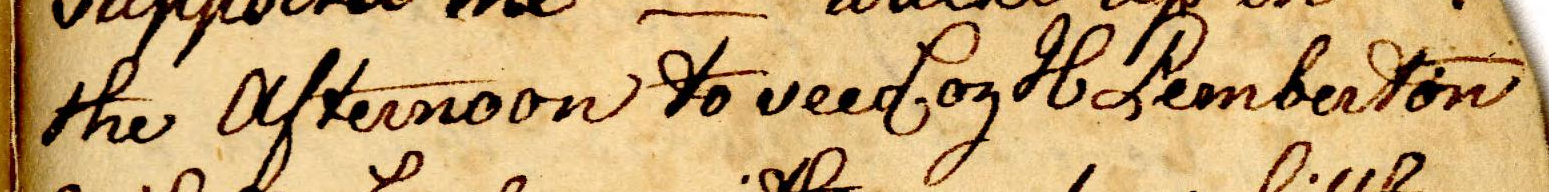the Afternoon to see Coz H Pemberton
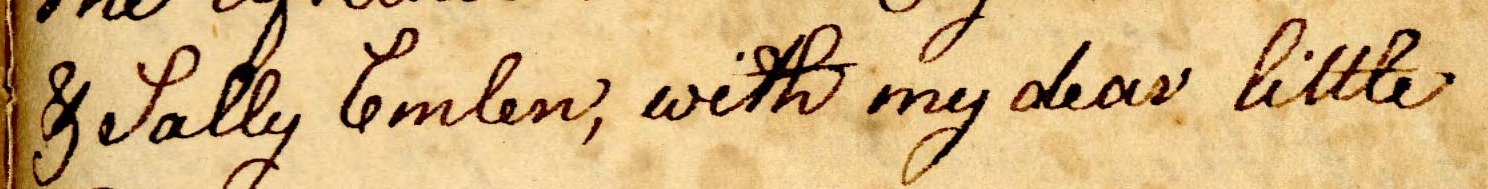& Sally Emlen, with my dear little
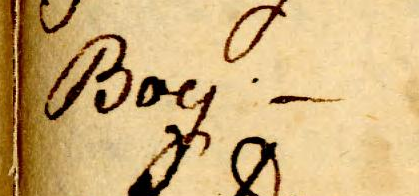Boy-
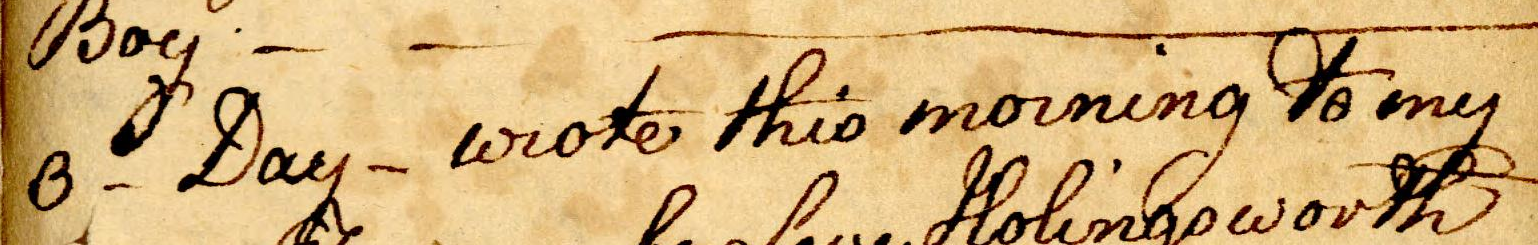3^d Day- wrote this morning to my
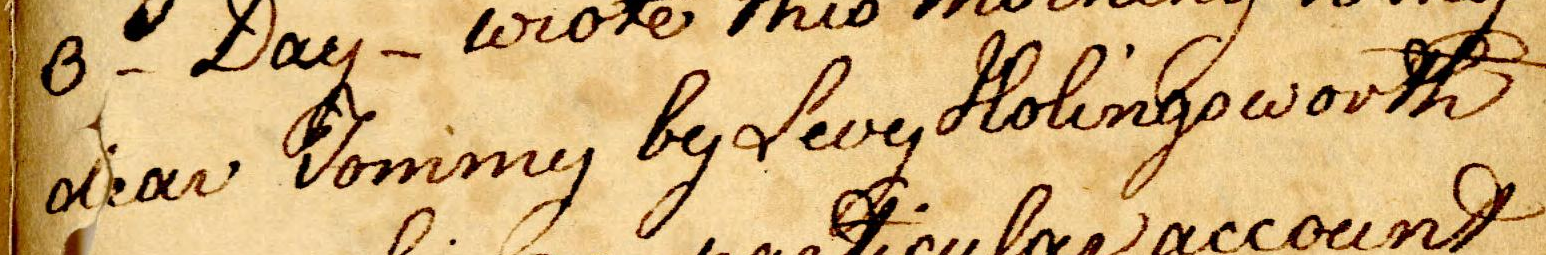dear Tommy by Levy Holingsworth
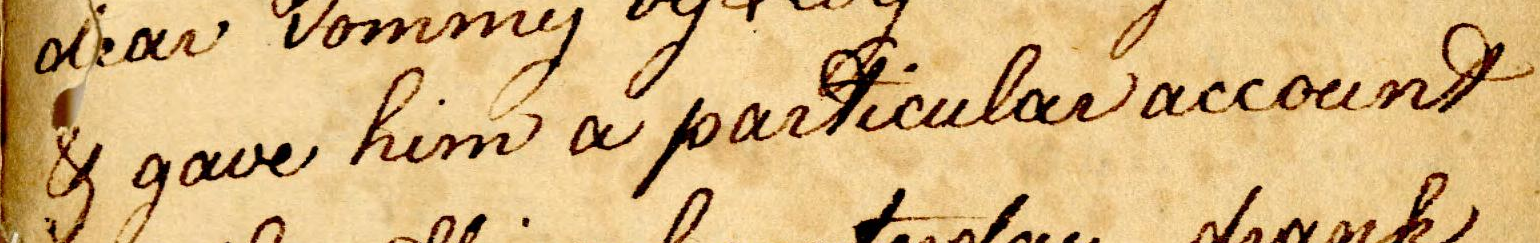& gave him a particular account
